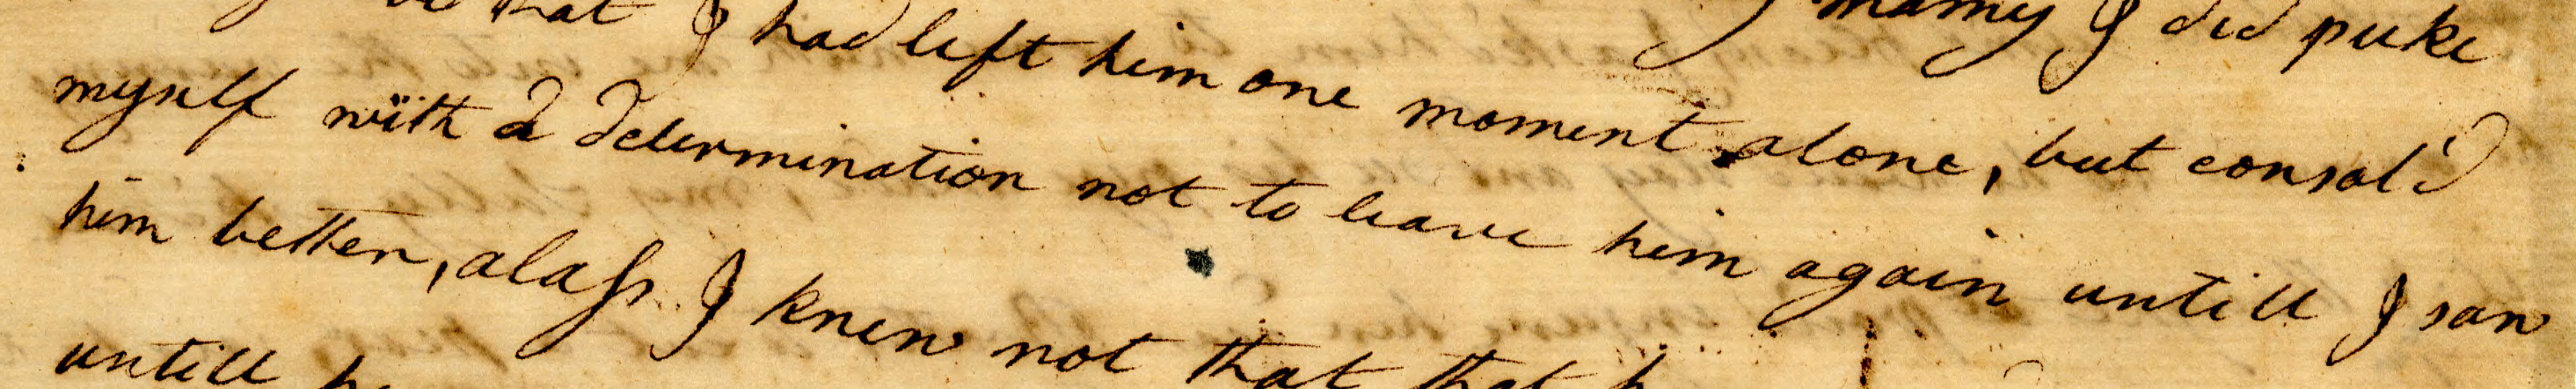myself with a determination not to leave him again untill I saw
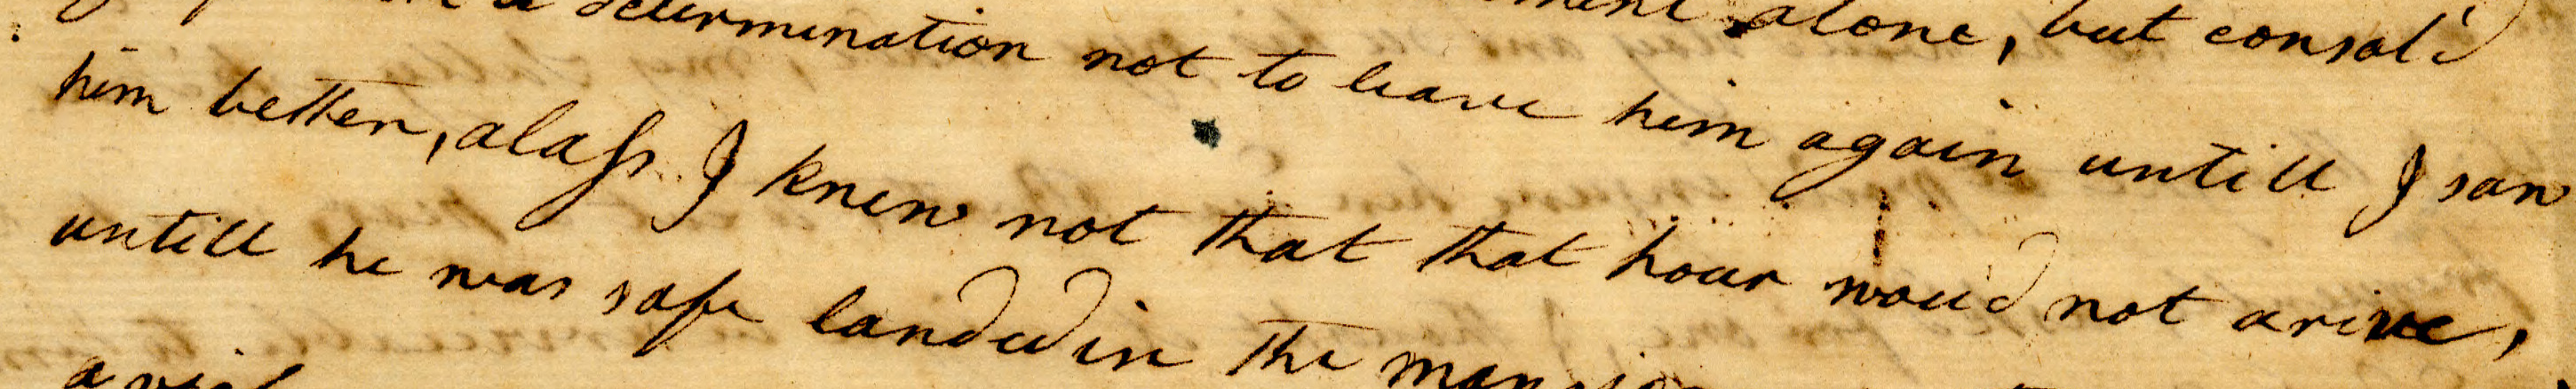him better, alas I knew not that that hour woud not arive,
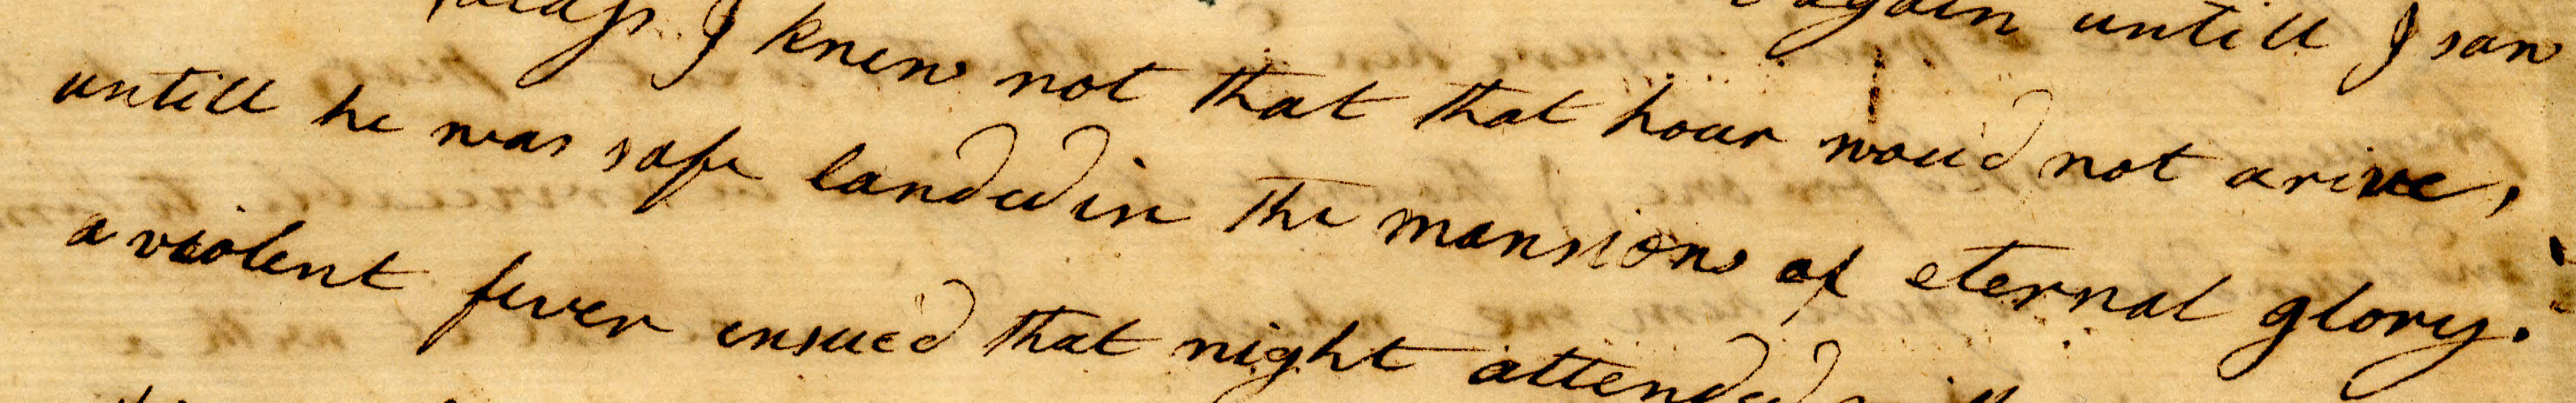untill he was safe landed in the mansions of eternal glory.
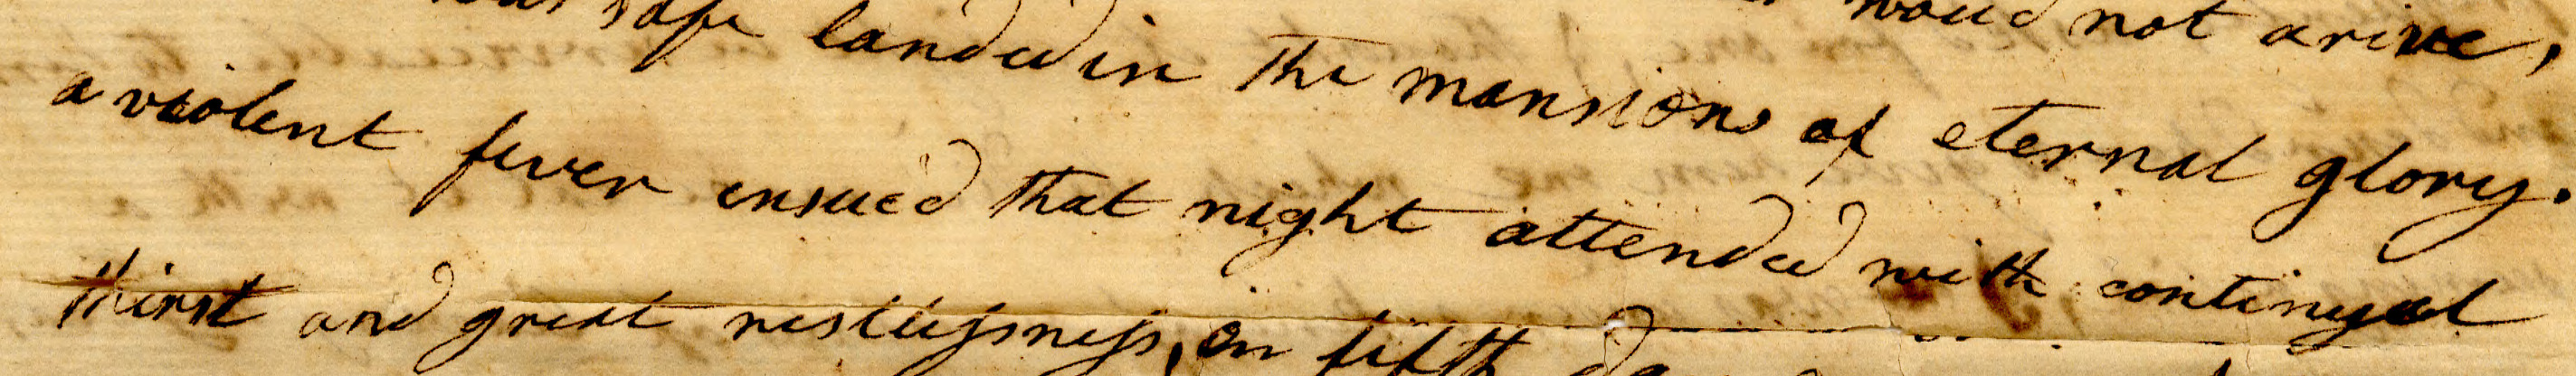a violent fever ensued that night attended with continyal
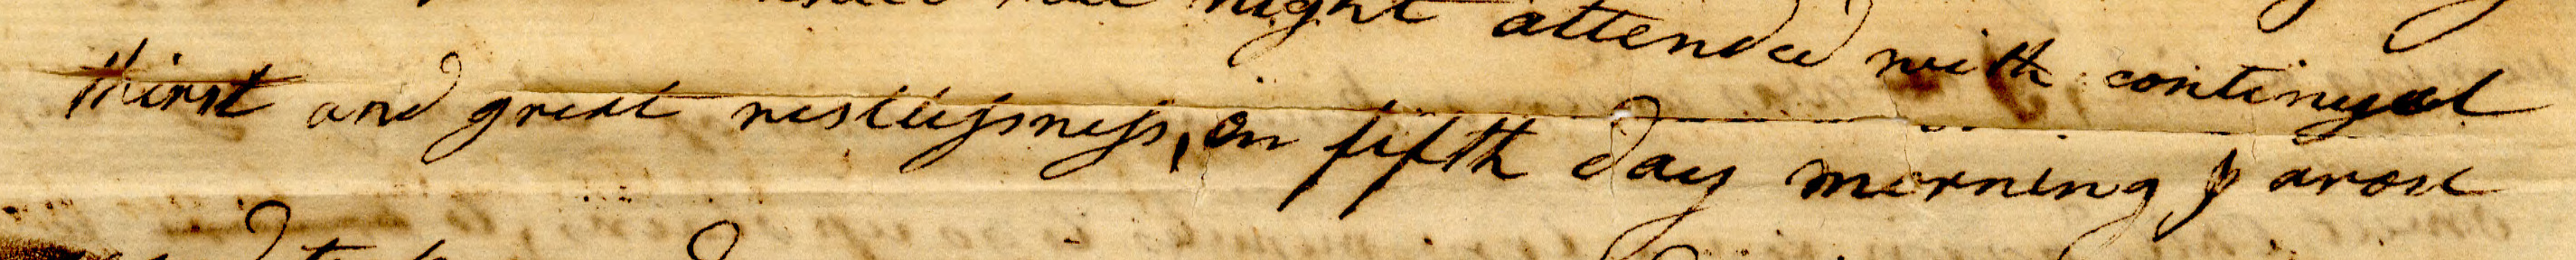thirst and great restlessness, on fifth day morning I arose
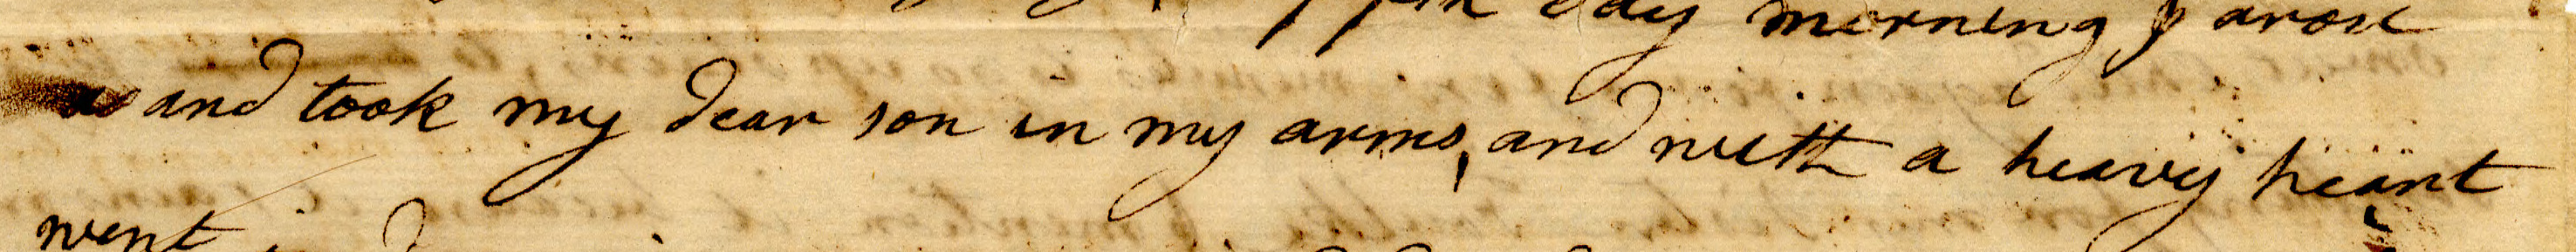and took my dear son in my arms, and with a heavy heart
